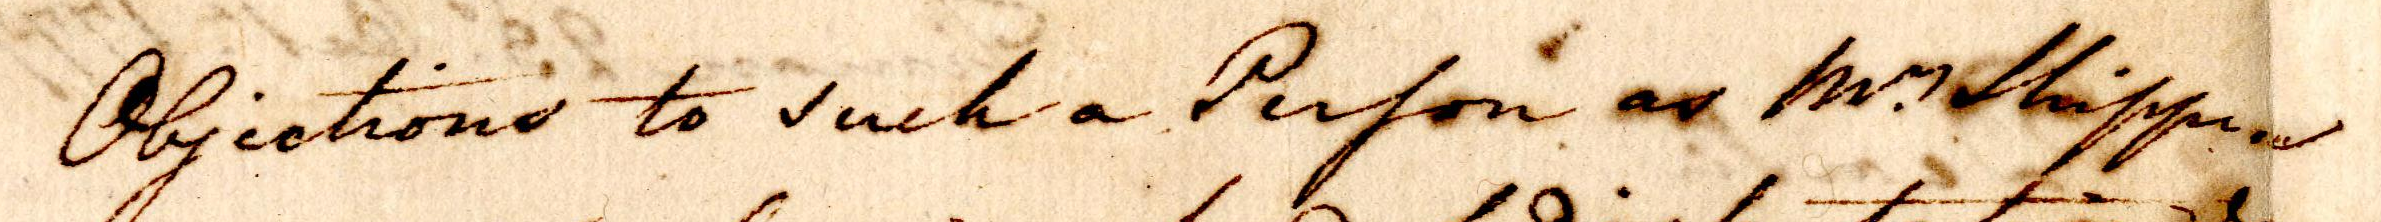Objections to such a Person as M^rs. Shippen
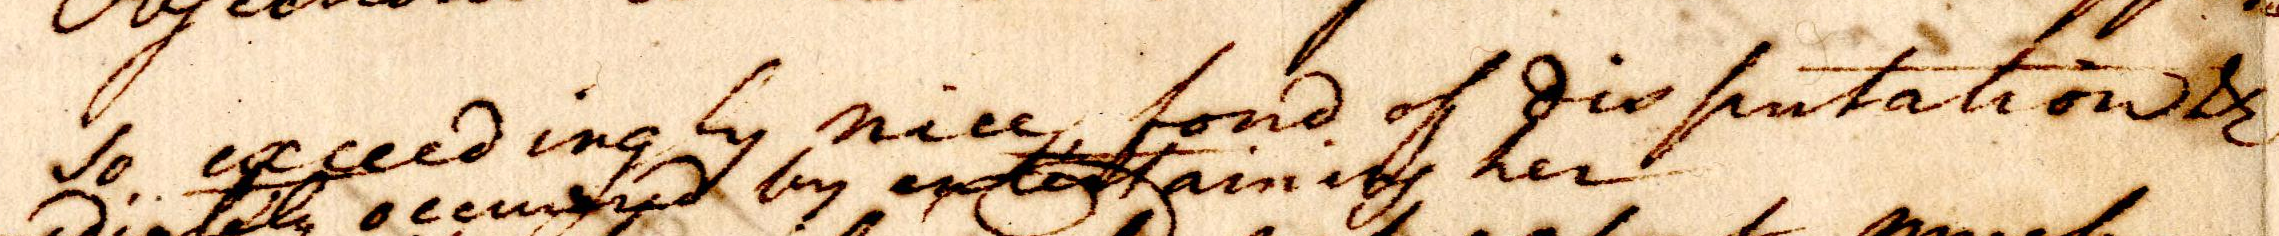so exceedingly nice, fond of disputation &
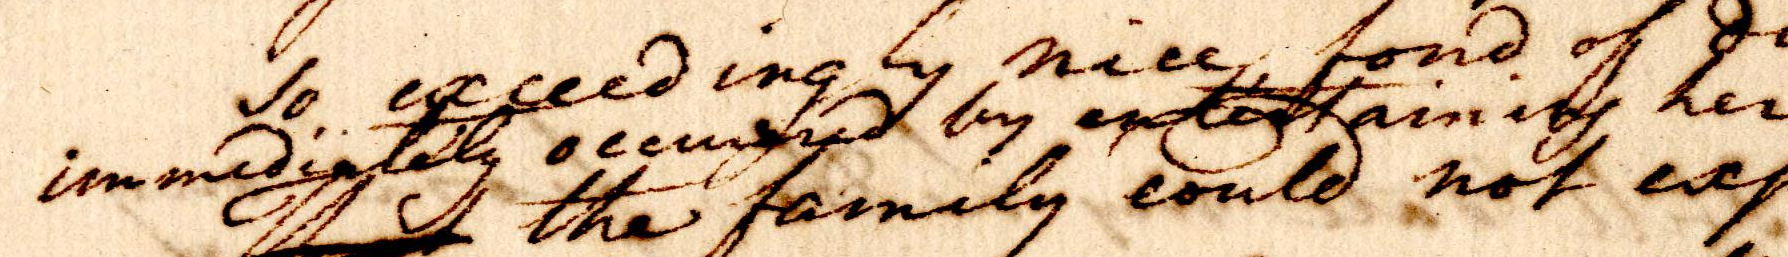immediately occured by entertaining her
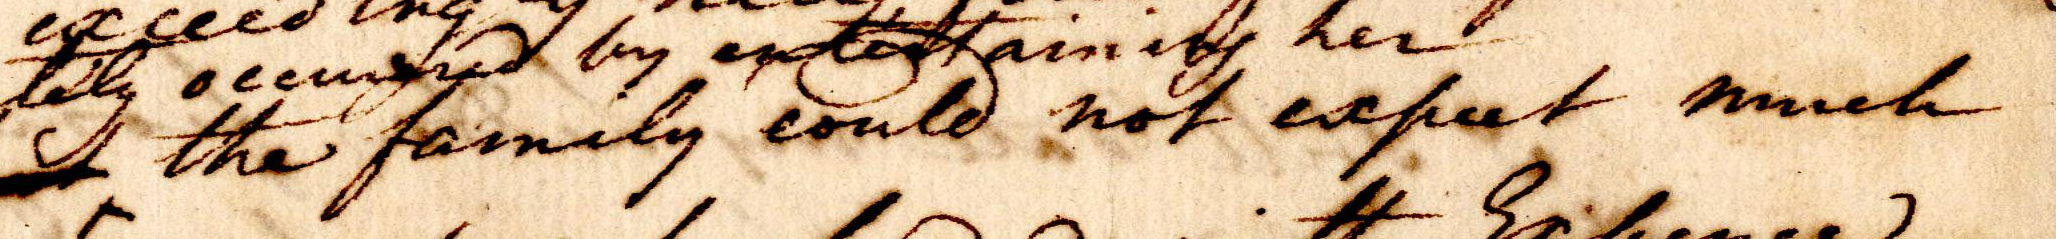^ the family could not expect much
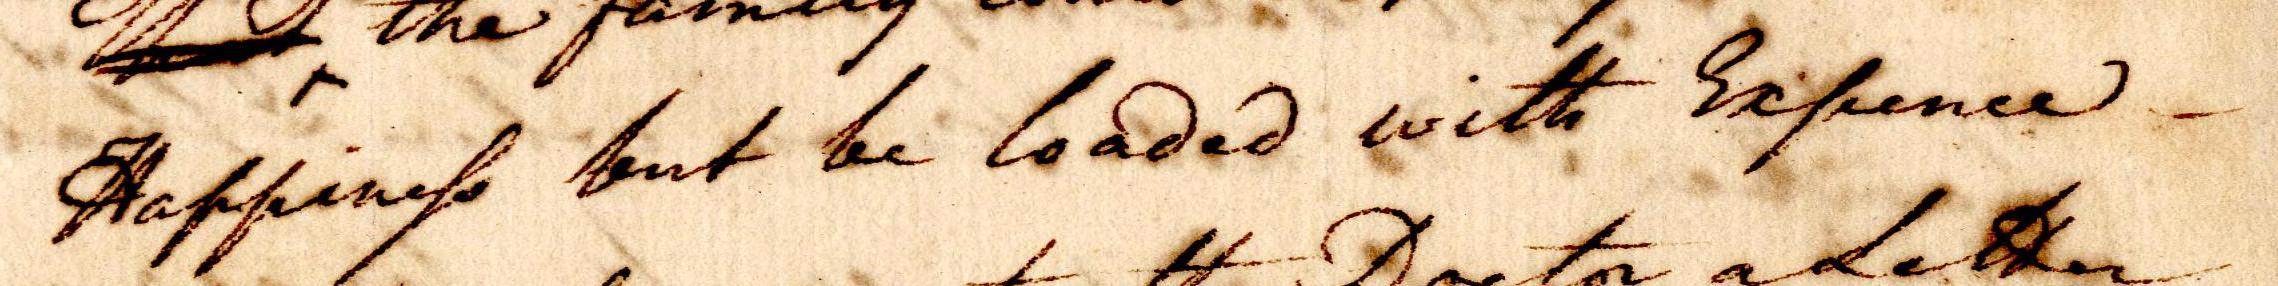Happiness but be loaded with Expence-
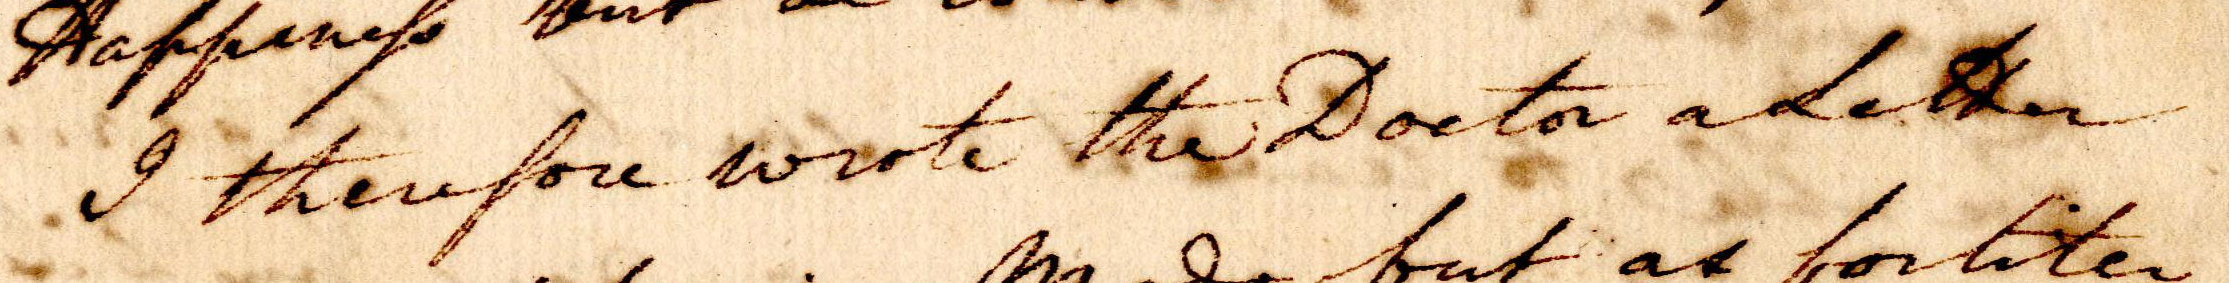I therefore wrote the Doctor a Letter
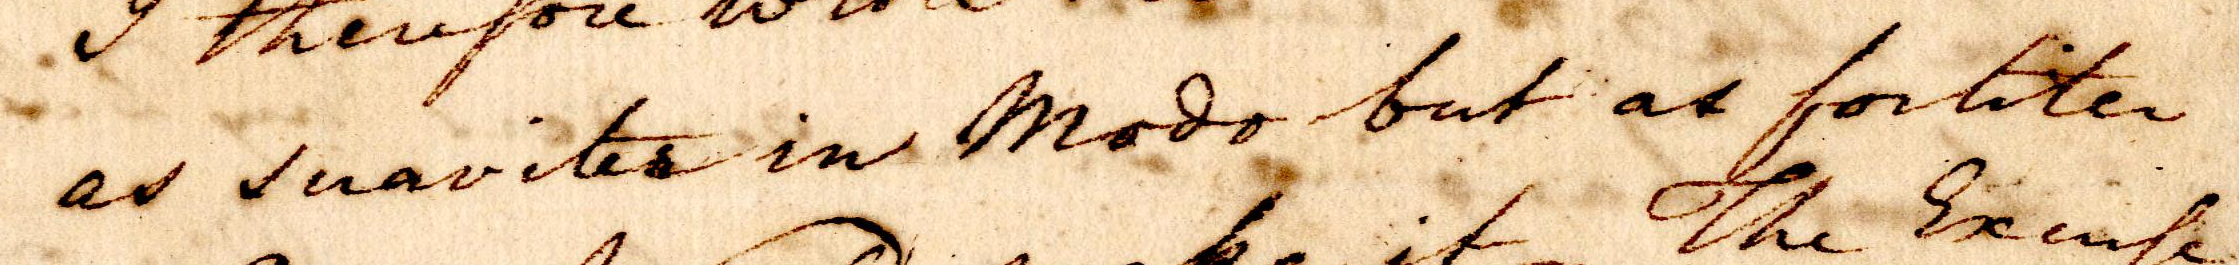as suaviter in Modo but as fortiter
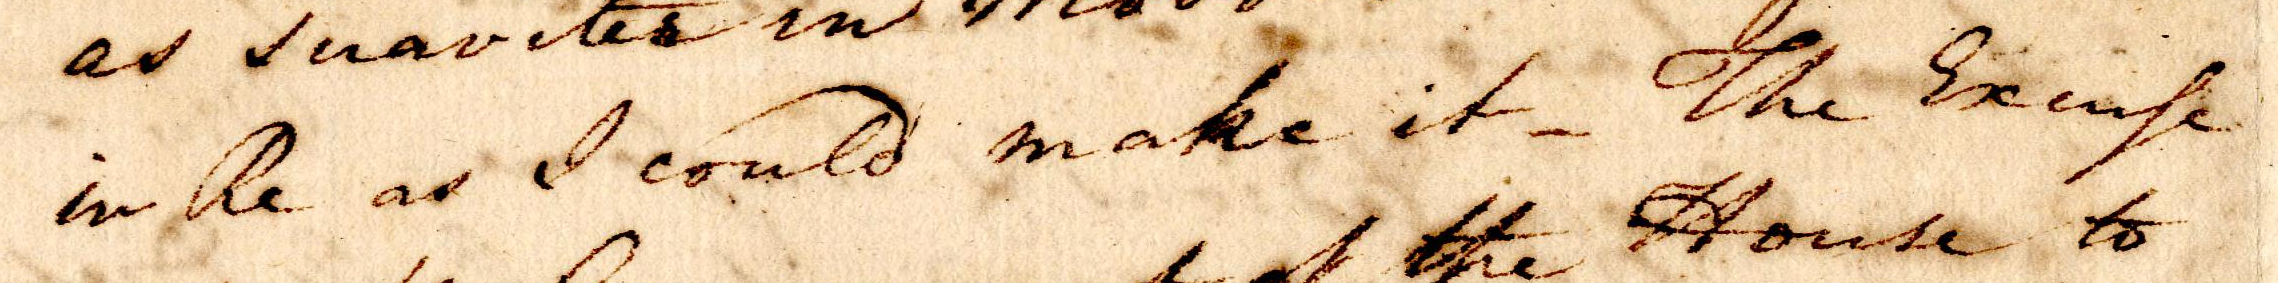in Re as I could make it- The Excuse
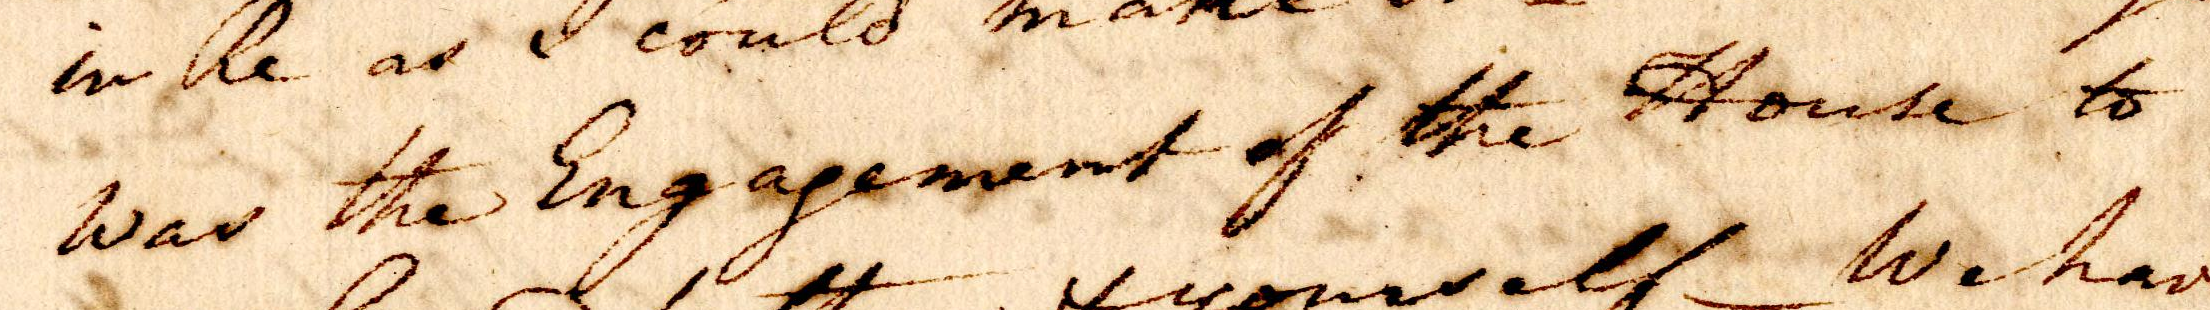was the Engagement of the House to
